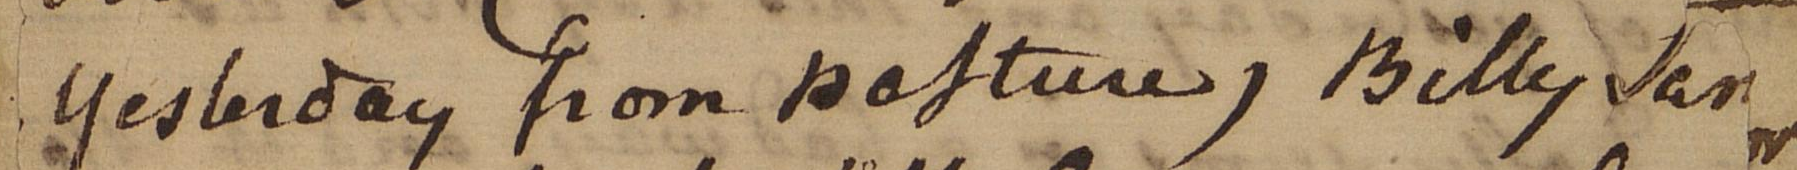yesterday from pasture) Billy San
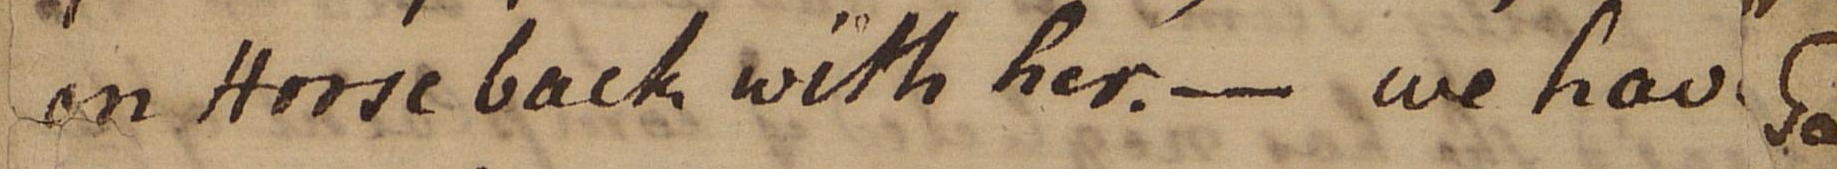an Horse back with her- we hav
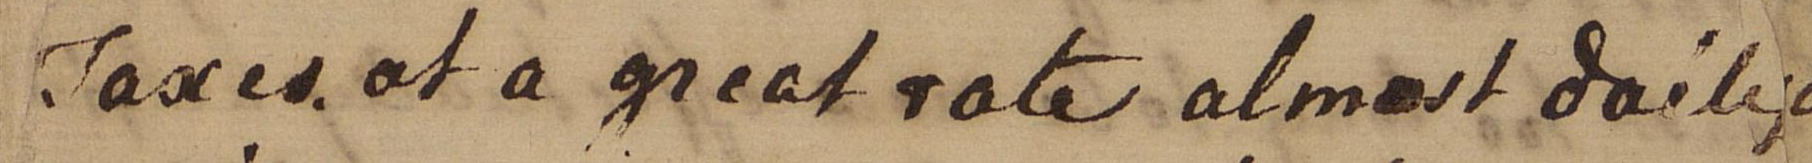Taxes at a great rate almost daily
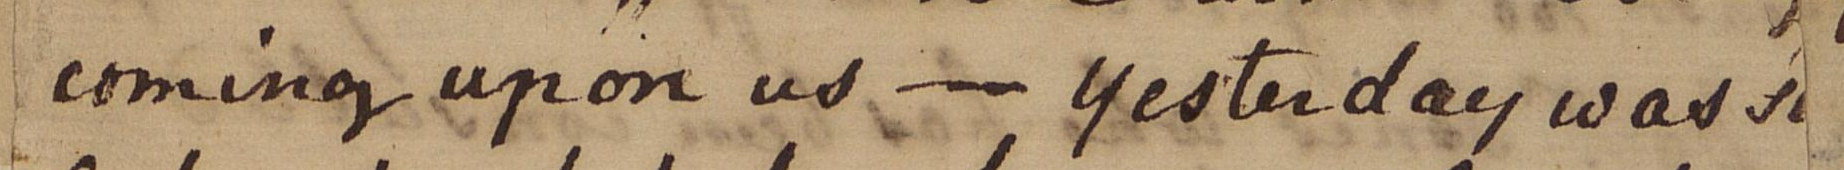coming upon us- Yesterday was se
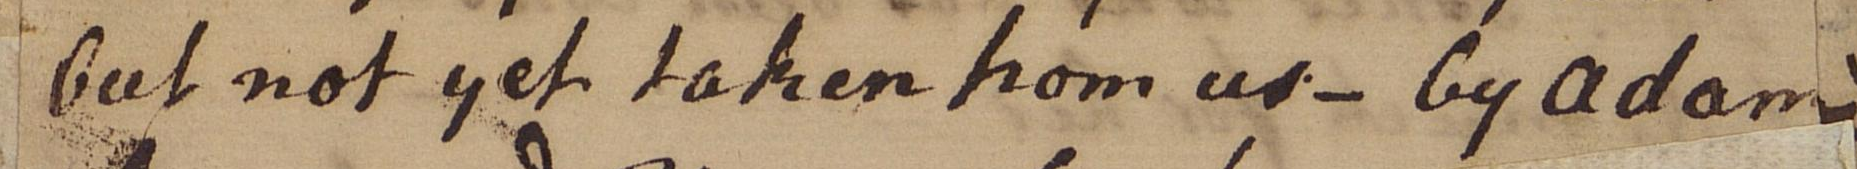but not yet taken from us- by Adam
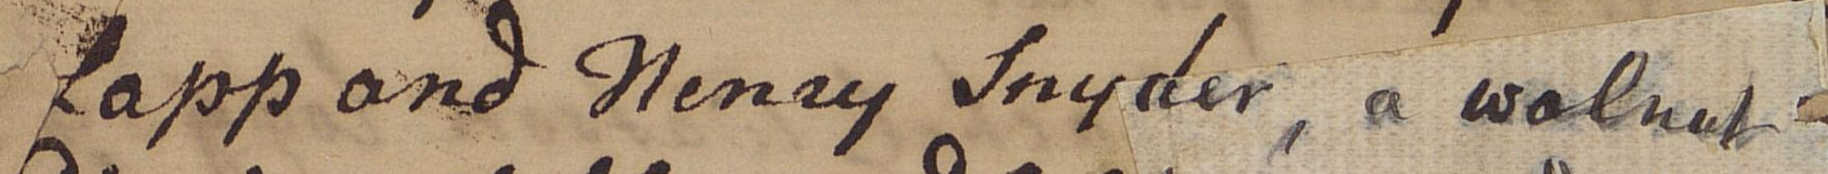Lapp and Henry Snyder, a walnut
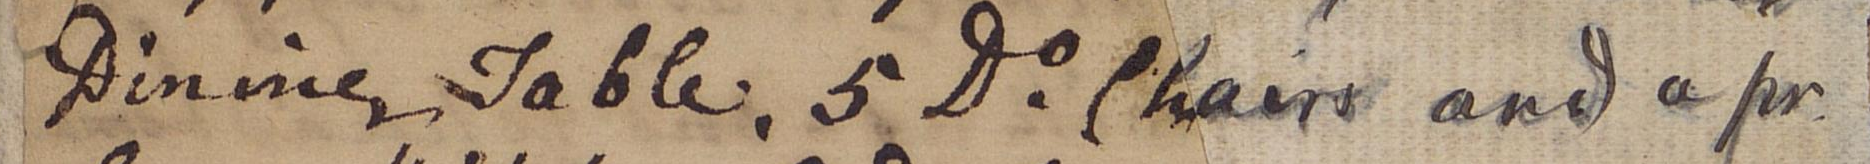Dining Table, 5 D^o. Chairs and a pr.
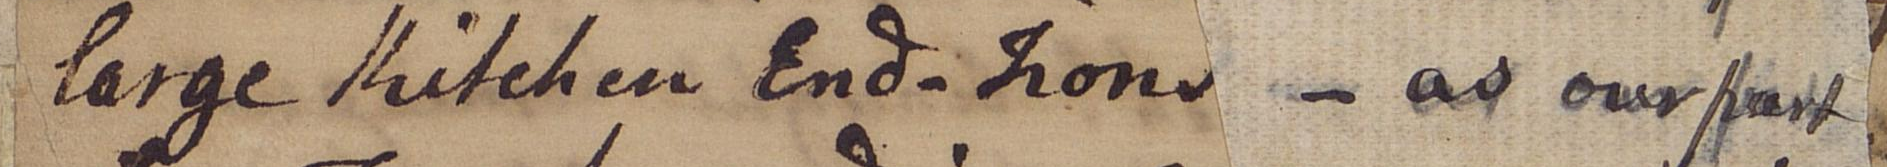large Kitchen End. Irons- as our part
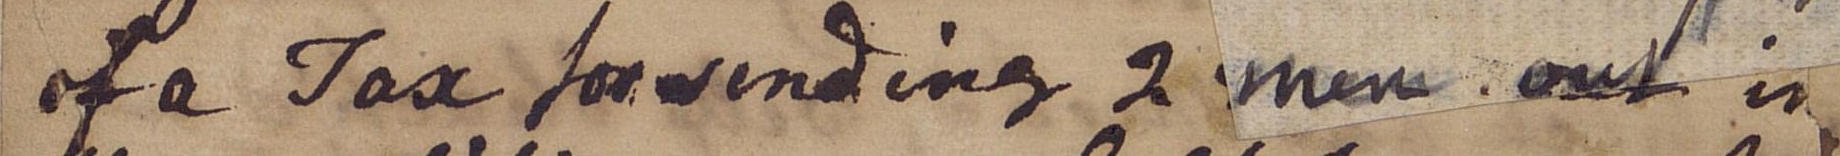of a Tax for sending 2 men out in
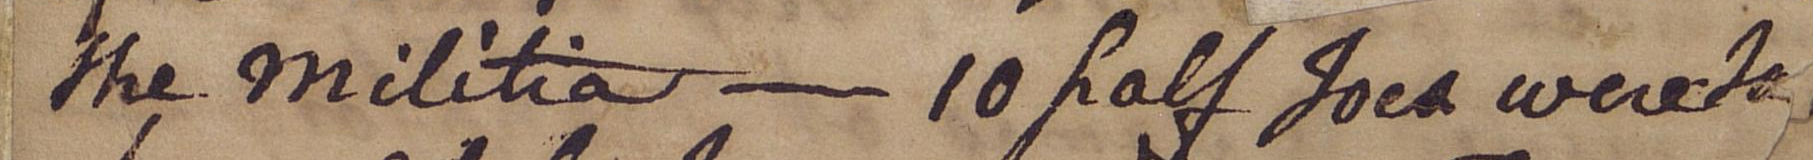the militia- 10 half Joes were to
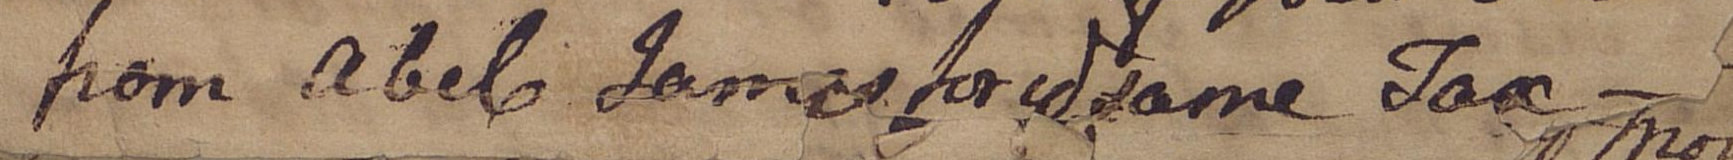from Abel James for y^e same Tax-
